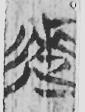逨（來）
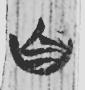自
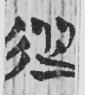從
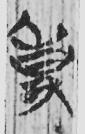事
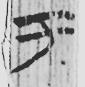于
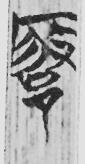{殷邑}（殷）
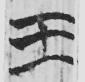王
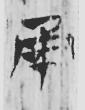甬
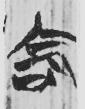命
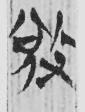敓（說）
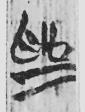爲
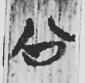公
